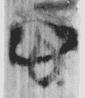心
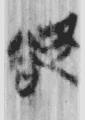欲
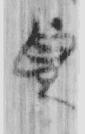見
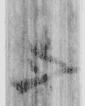之
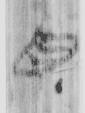目
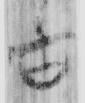古
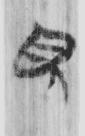{目人}
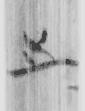之
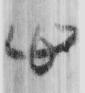心
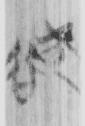欲
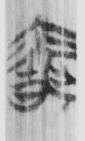{尒䎽}
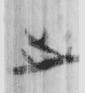之
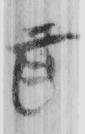耳
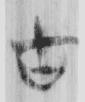古
